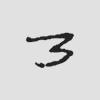乃
